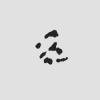玄
